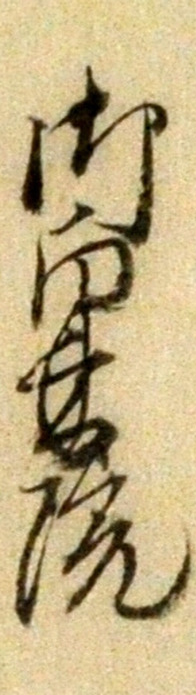御白書院
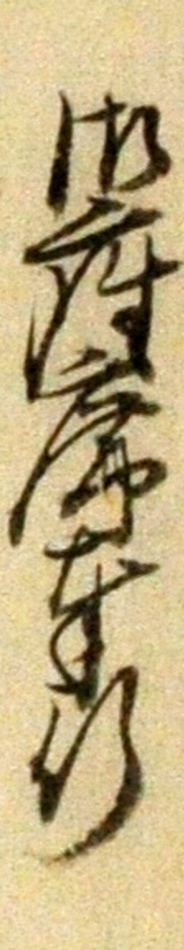御座席奉行
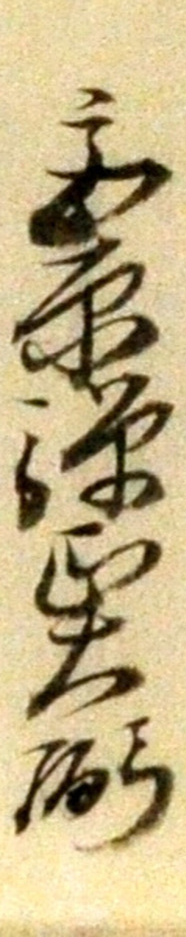宮原弾正大弼
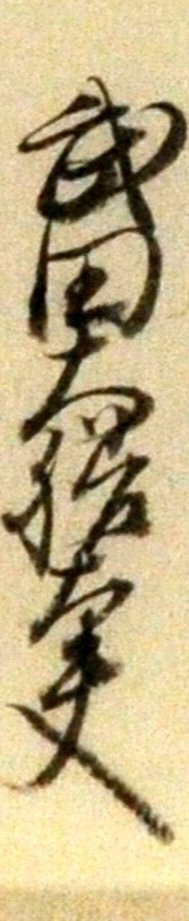武田大膳大夫
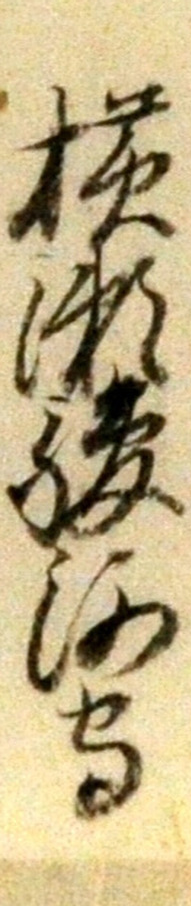横瀬駿河守

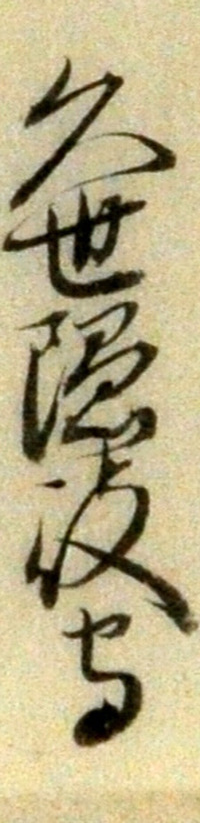久世隠岐守
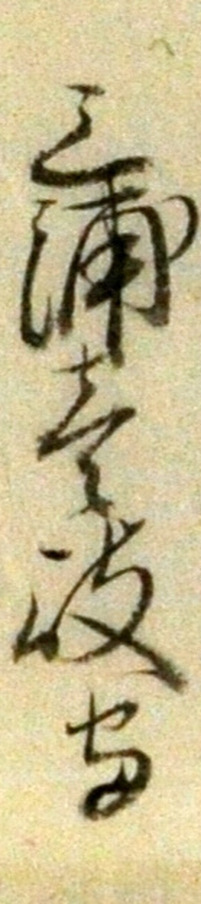三浦壱岐守
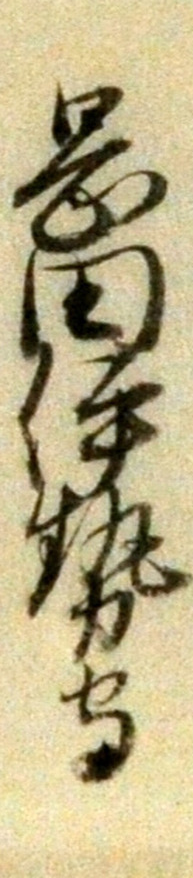岡田伊勢守
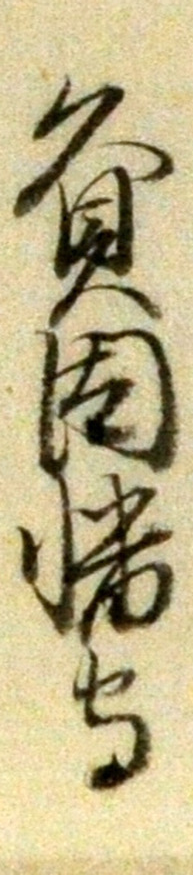久貝因幡守
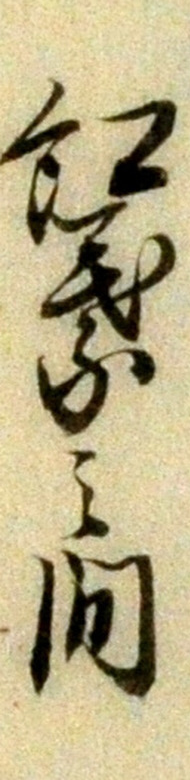紅葉之間
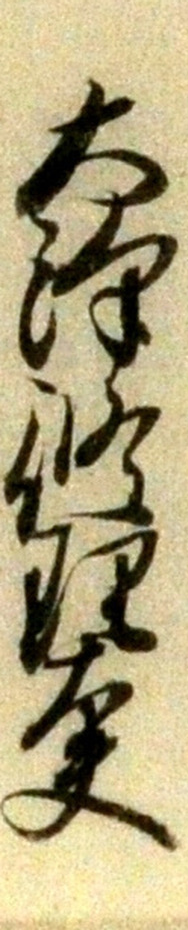大澤修理大夫
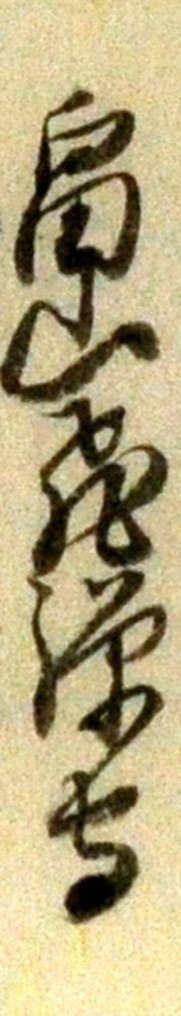畠山飛騨守
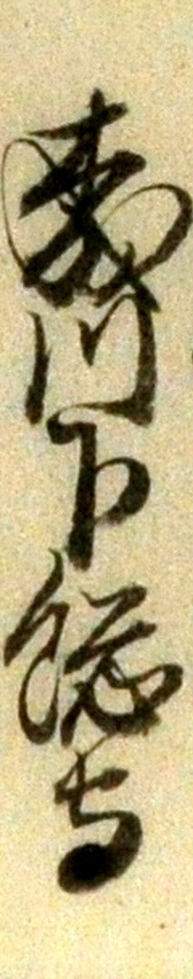森川下総守
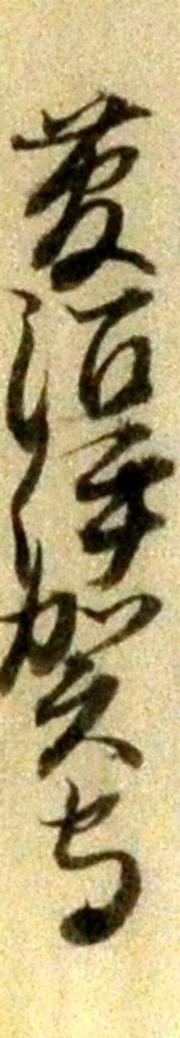菅沼伊賀守
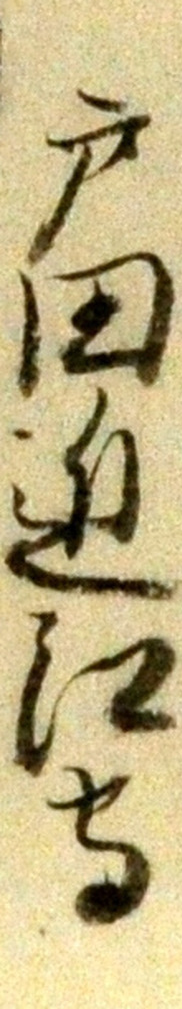御加戸田近江守
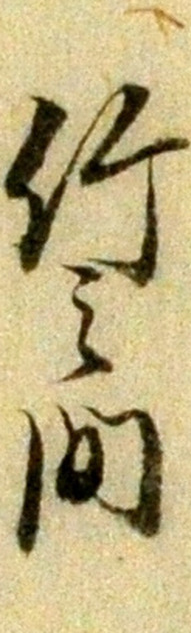竹之間
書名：御馳走御能ノ節ノ留外
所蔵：伊那市立高遠町図書館・合同会社AMANE
